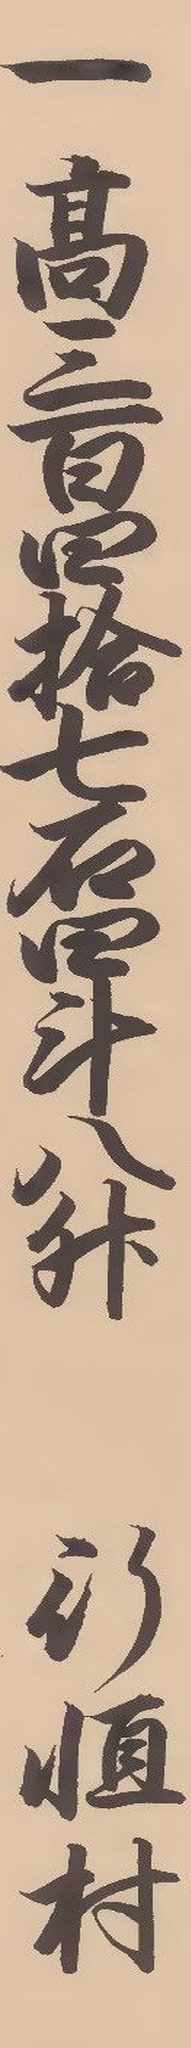一高三百四拾七石四斗八升行恒村
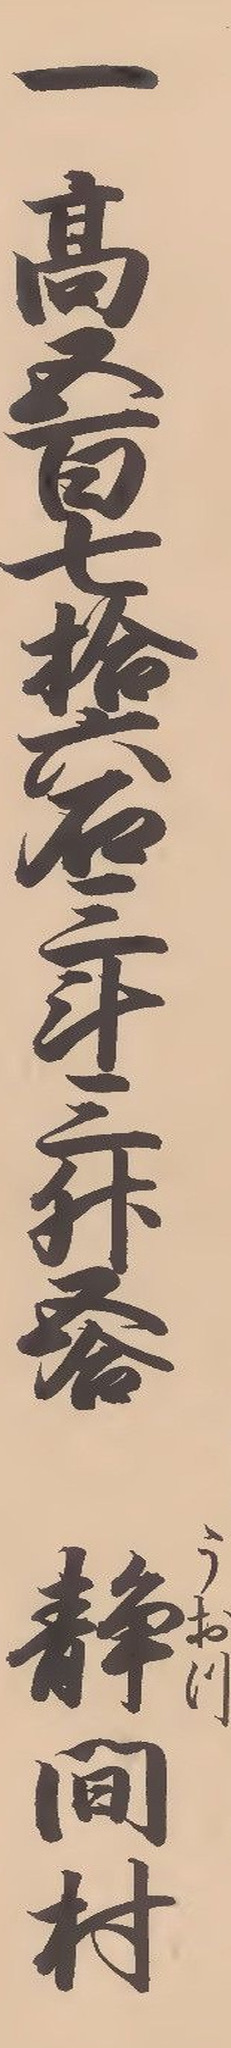一高五百七拾六石三斗三升五合静間村
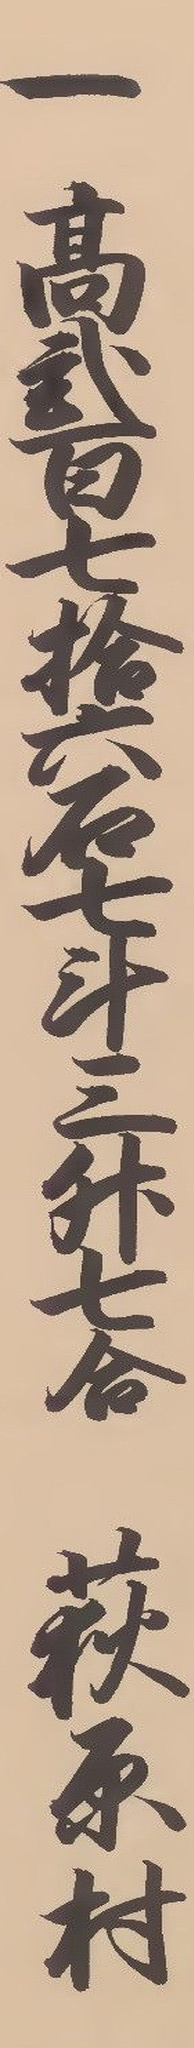一高弐百七拾六石七斗三升七合荻原村
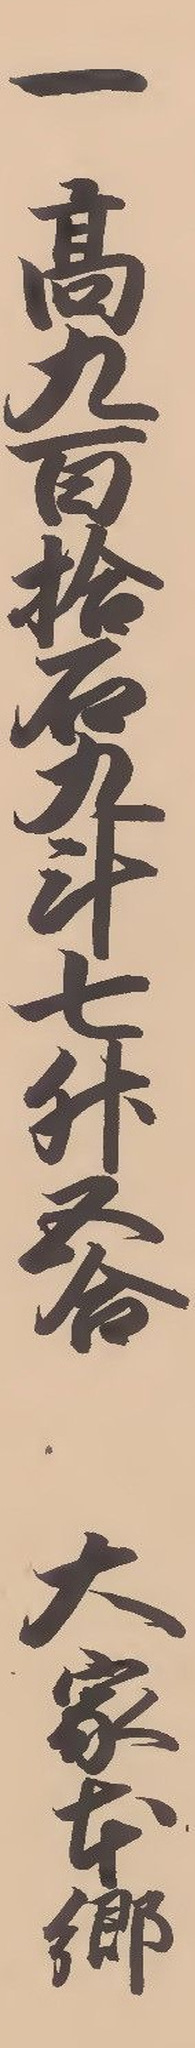一高九百拾石九斗七升五合大家本郷
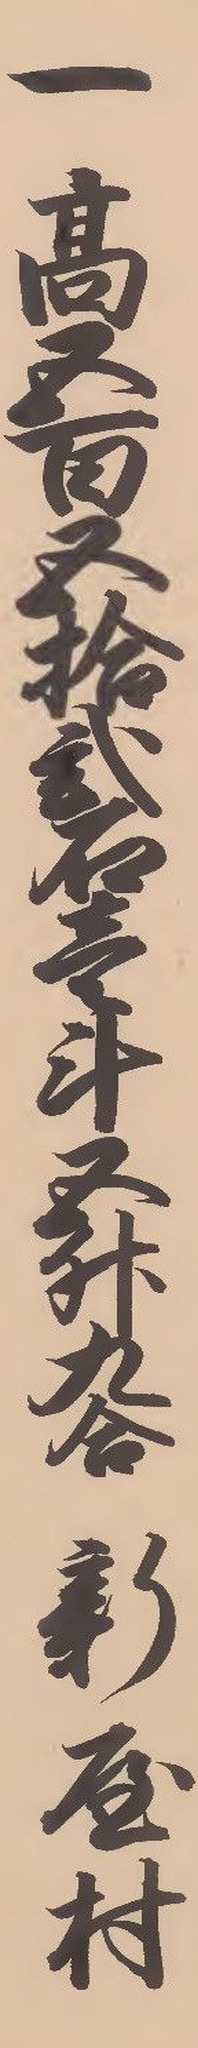一高五百五拾弐石壱斗五升九合新屋村
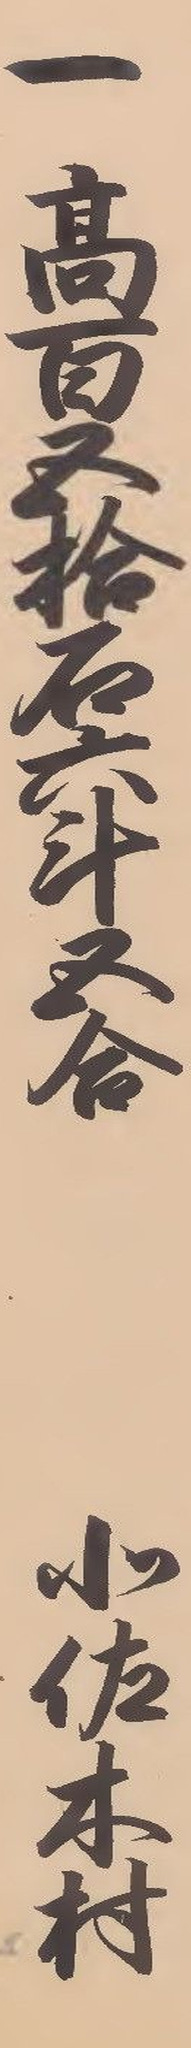一高百五拾石六斗五合北佐木村

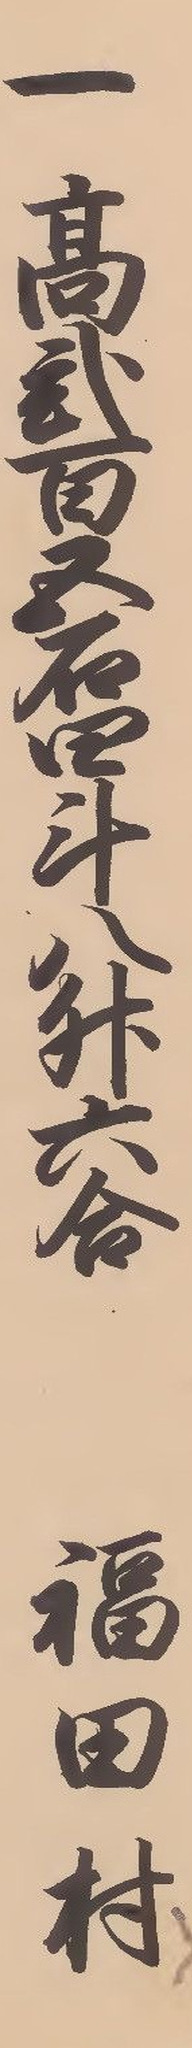一高弐百五石四斗八升六合福田村
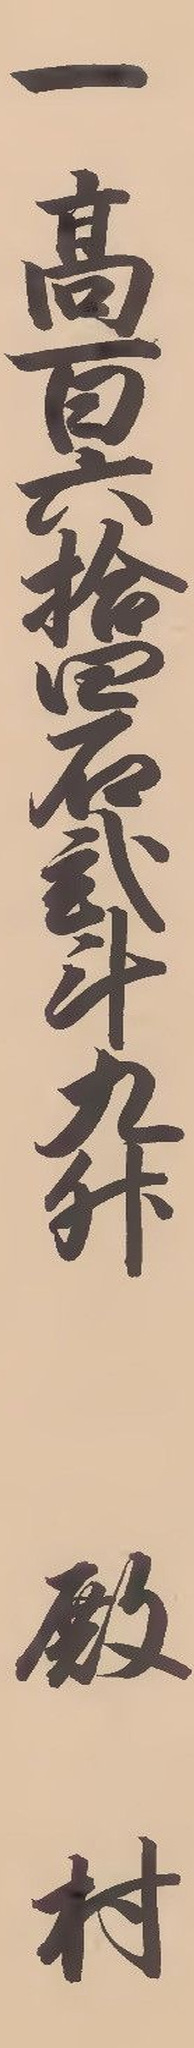一高百六拾四石弐斗九升殿村
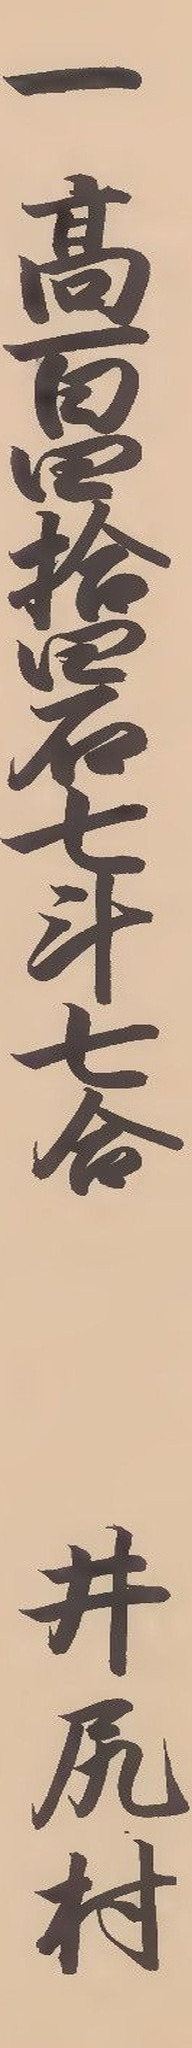一高百四拾四石七斗七合井尻村
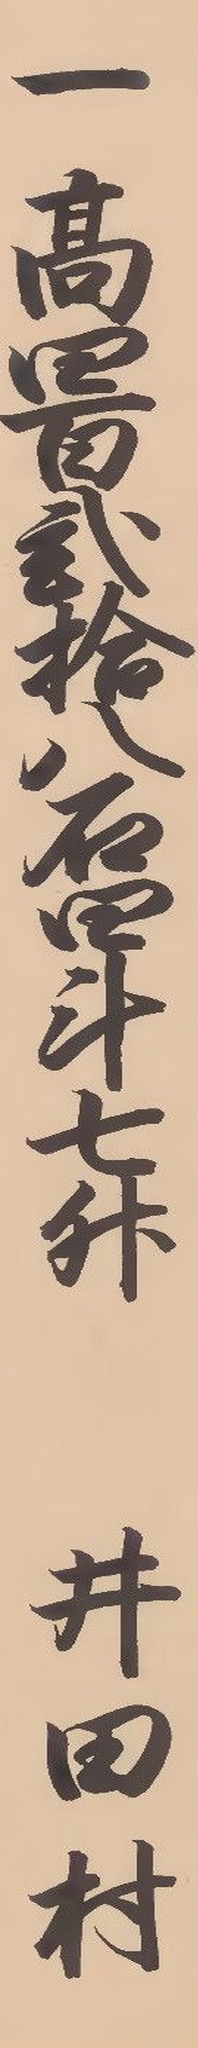一高四百弐拾八石四斗七升井田村
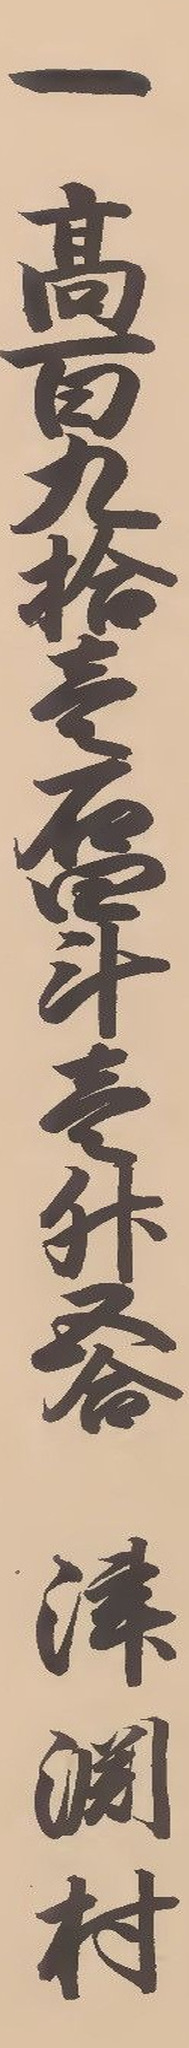一高百九拾壱石四斗壱升五合津淵村
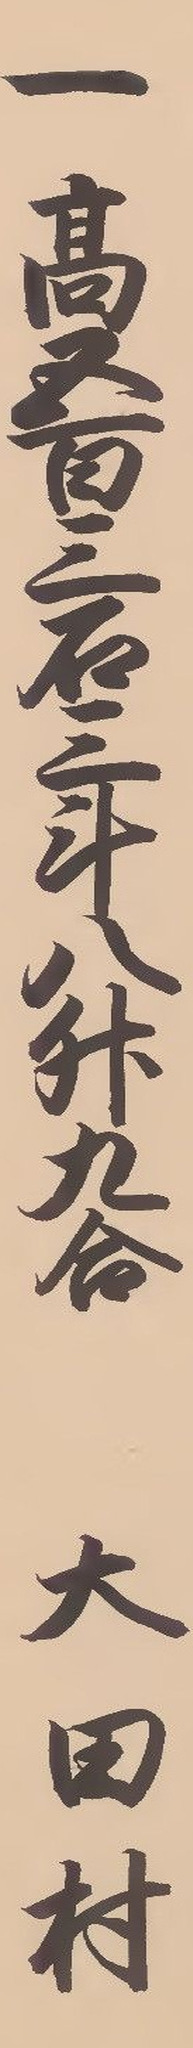一高五百三石三斗八升九合大田村
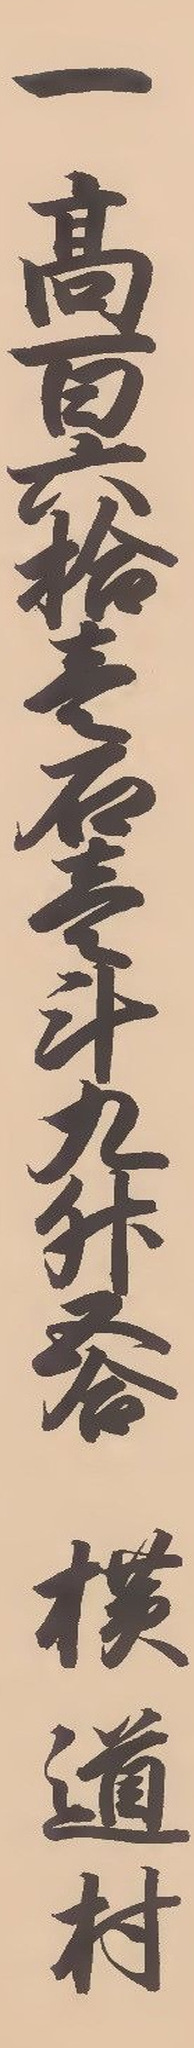一高百六拾壱石壱斗九升五合横道村
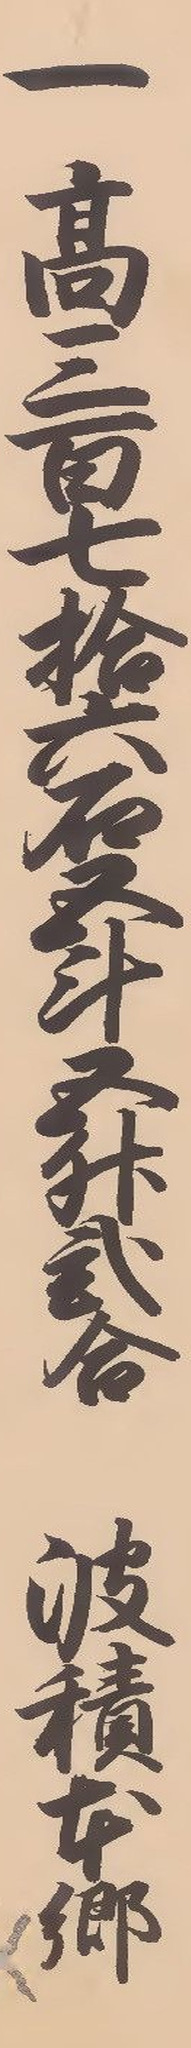一高三百七拾六五五斗五升弐合波積本郷

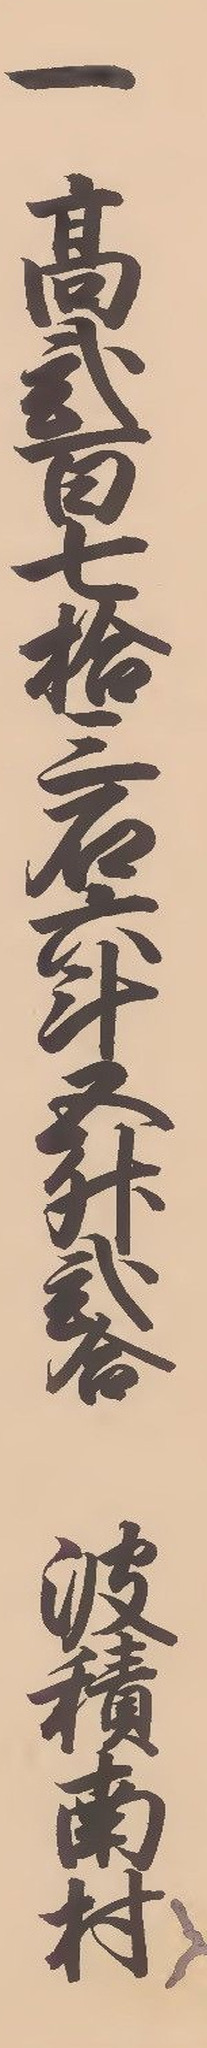一高弐百七拾三石六斗五升弐合波積南村
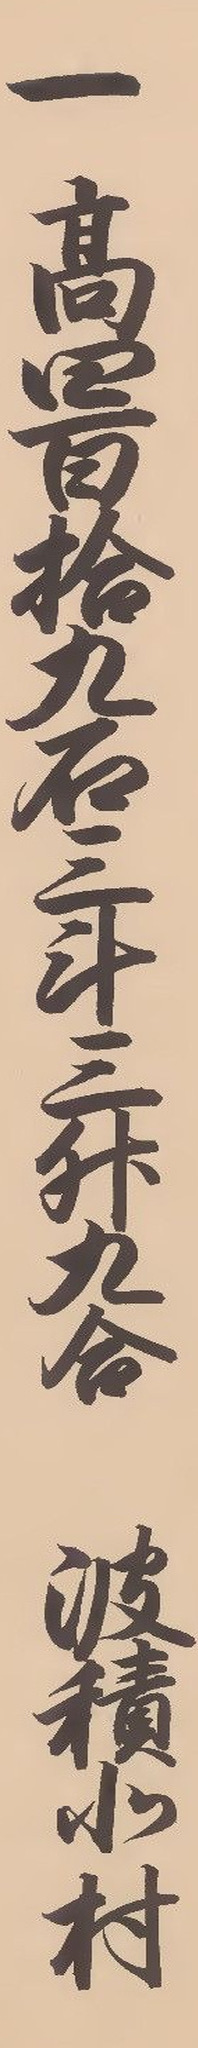一高四百拾九石三斗三升九合波積北村
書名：石見国郷帳
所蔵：国立公文書館 National Archives of Japan
